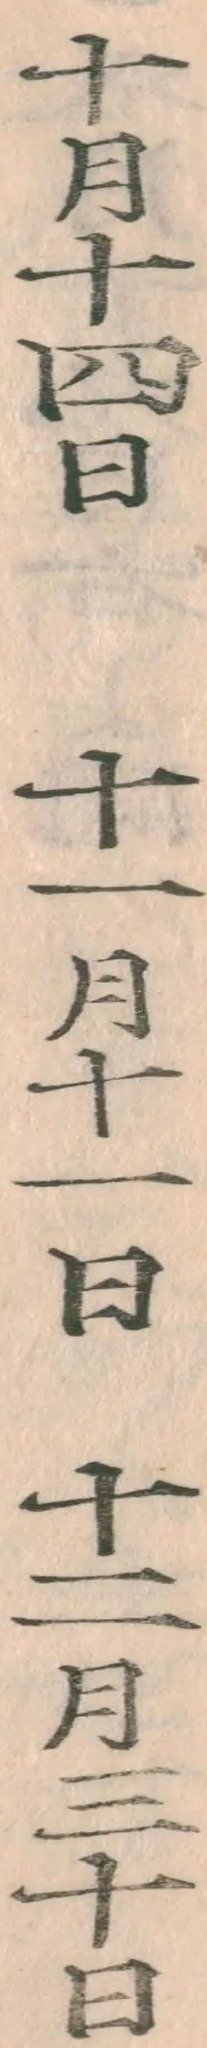十月十四日十一月十一日十二月三十日
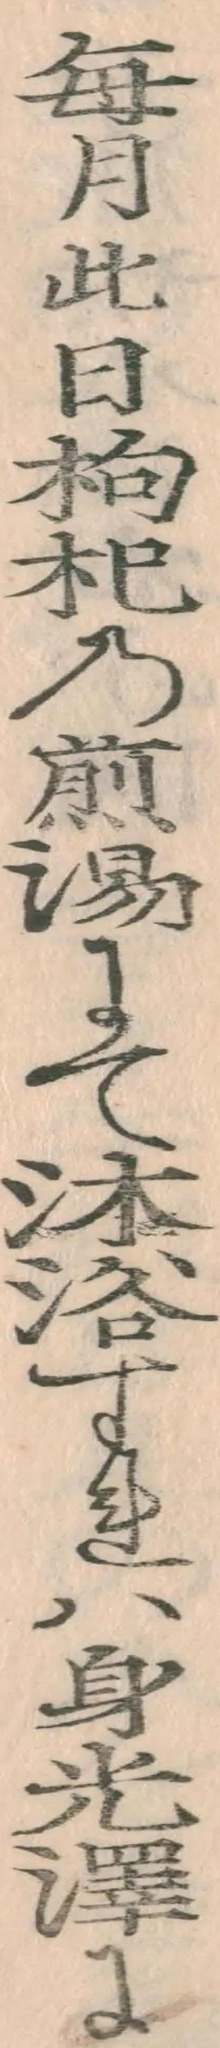毎月此日枸杞の煎湯にて沐浴すれは身光沢に
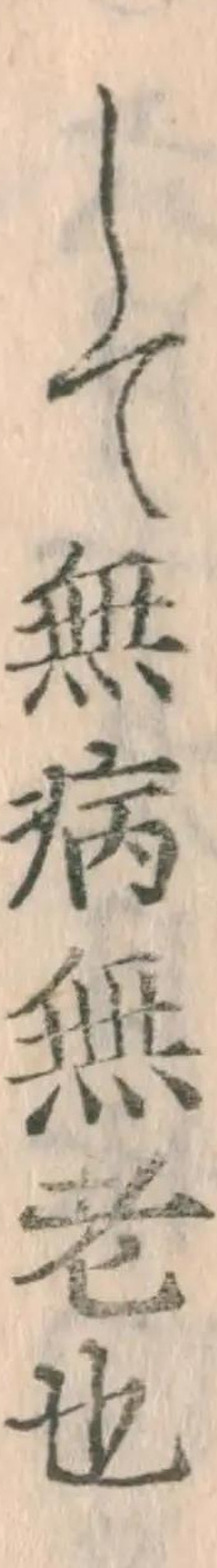して無病無老也
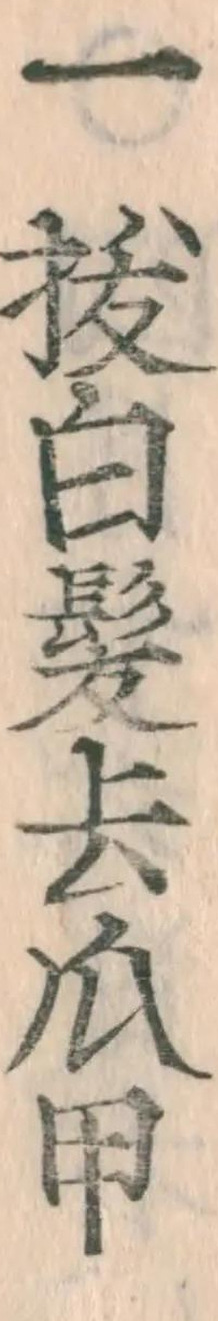一抜白髪去爪甲
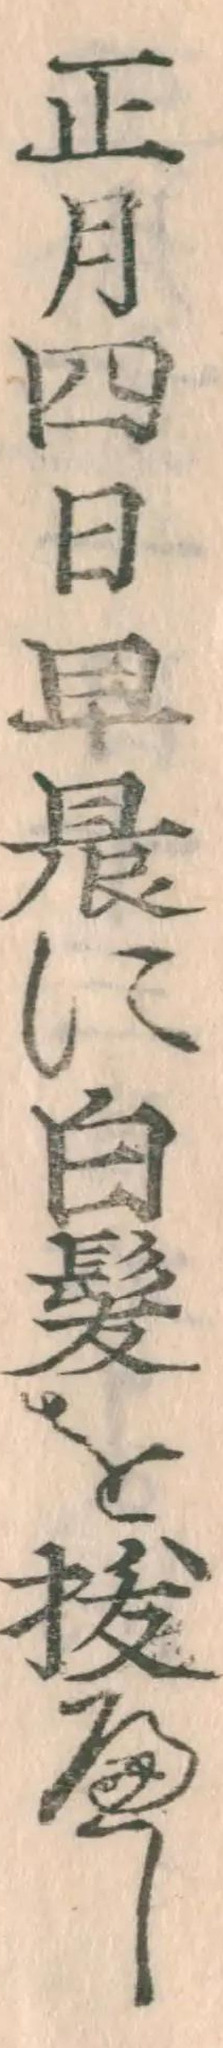正月四日早晨に白髪を抜へし
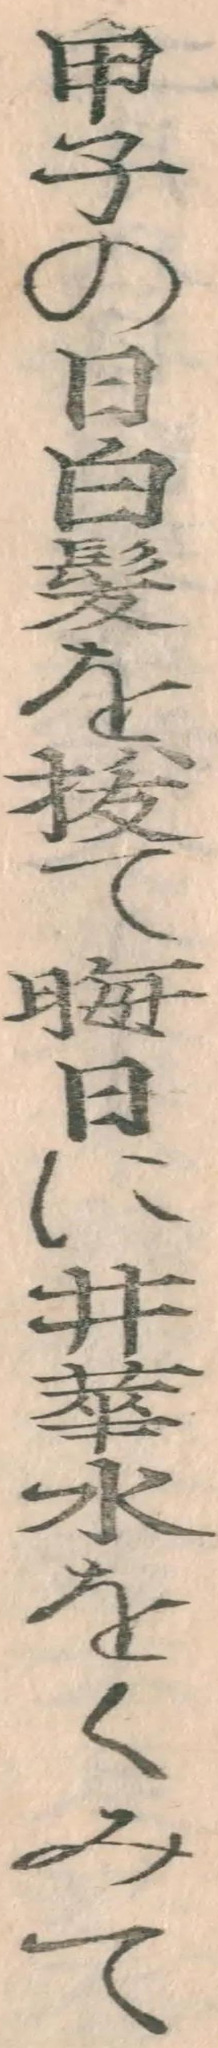甲子の日白髪を抜て晦日に井華水をくみて
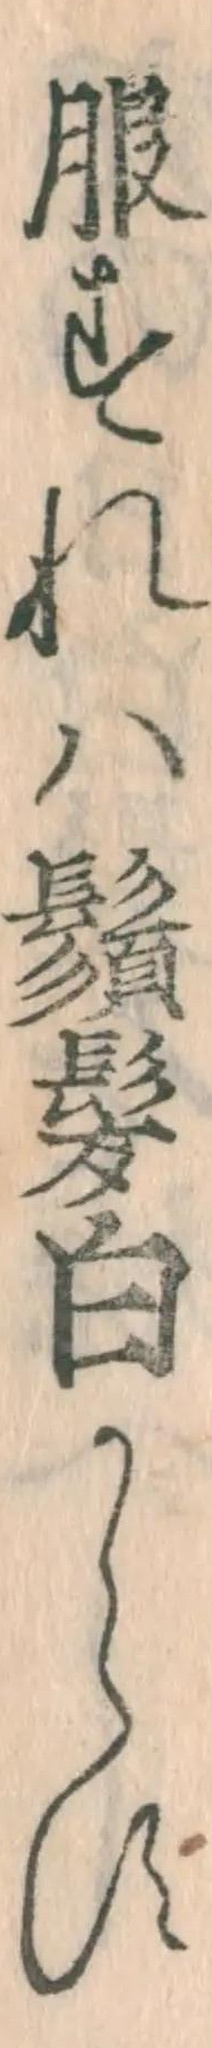服すれは鬚髪白からす

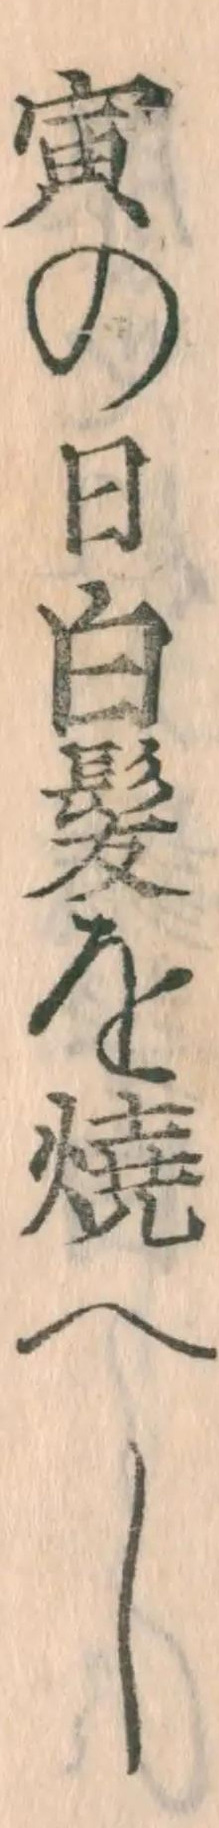寅の日白髪を焼へし
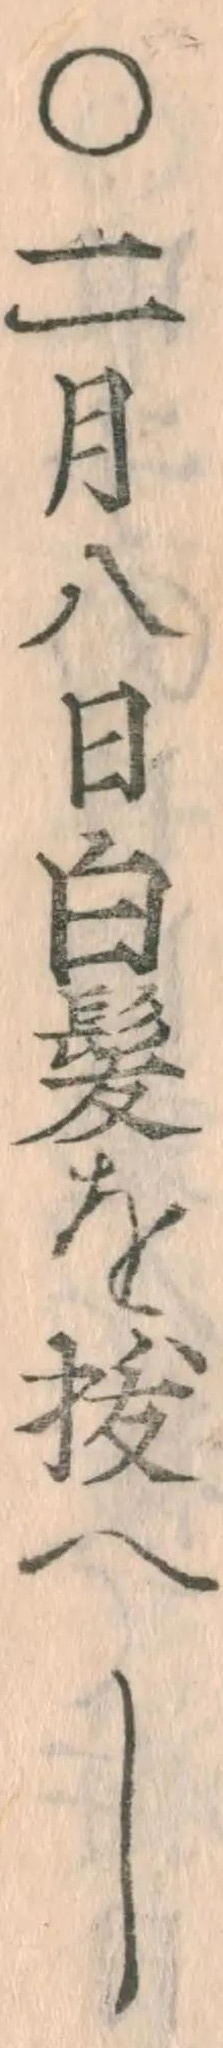〇二月八日白髪を抜へし
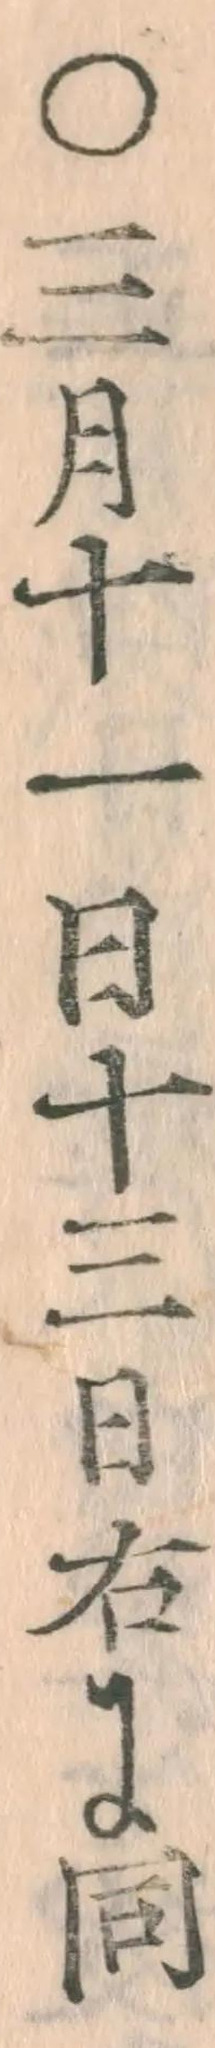〇三月十一日十三日右に同
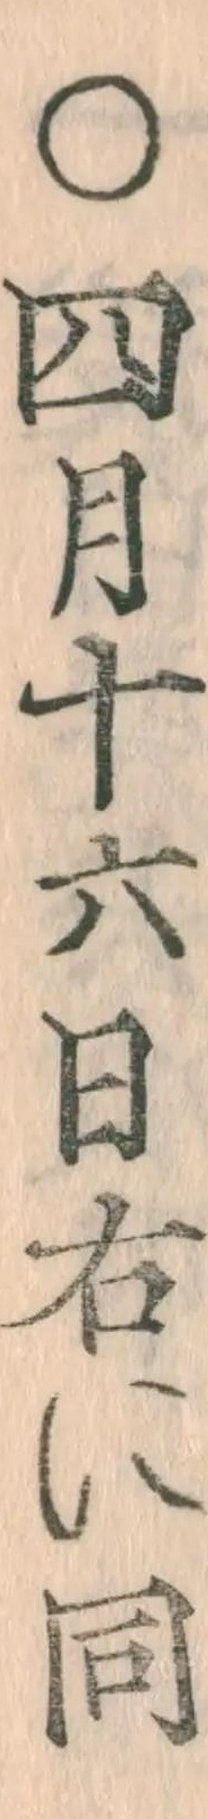〇四月十六日右に同
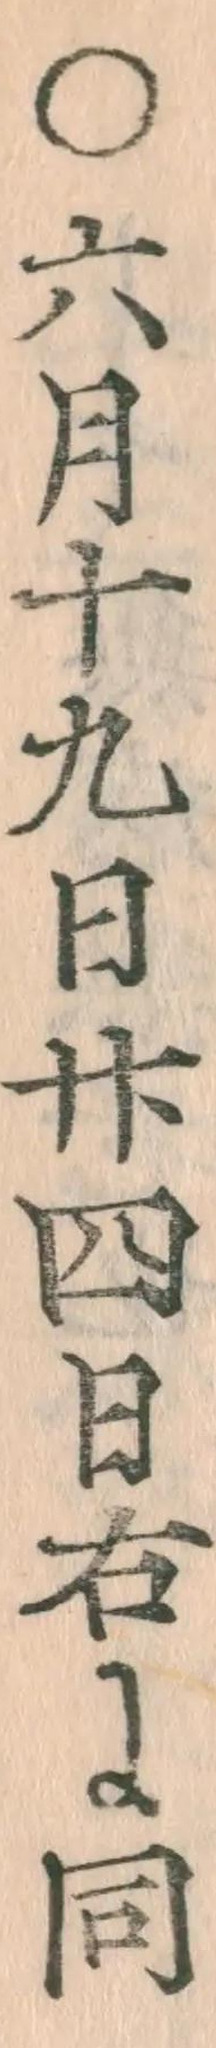〇六月十九日廿四日右に同
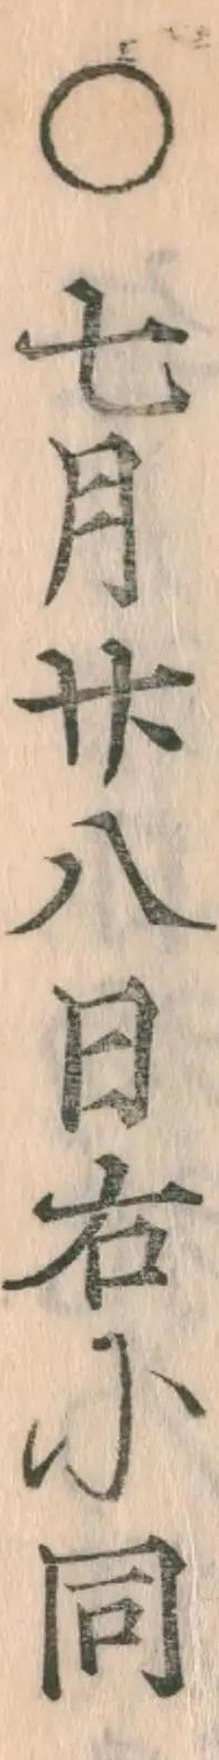〇七月廿八日右に同
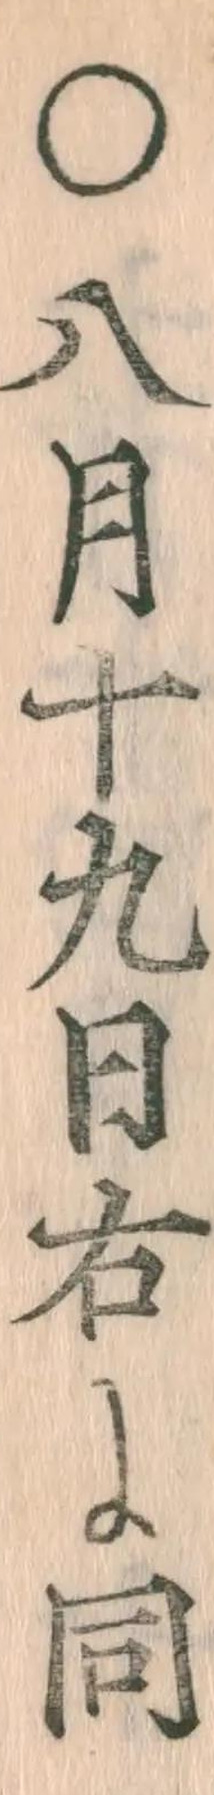〇八月十九日右に同
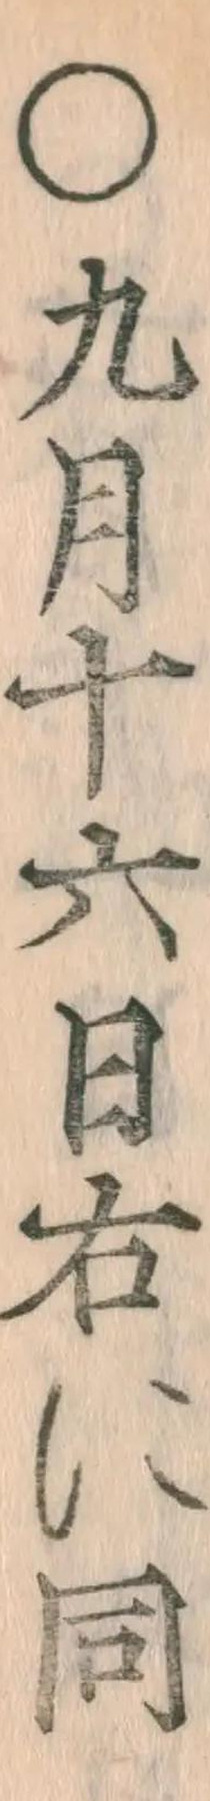〇九月十六日右に同
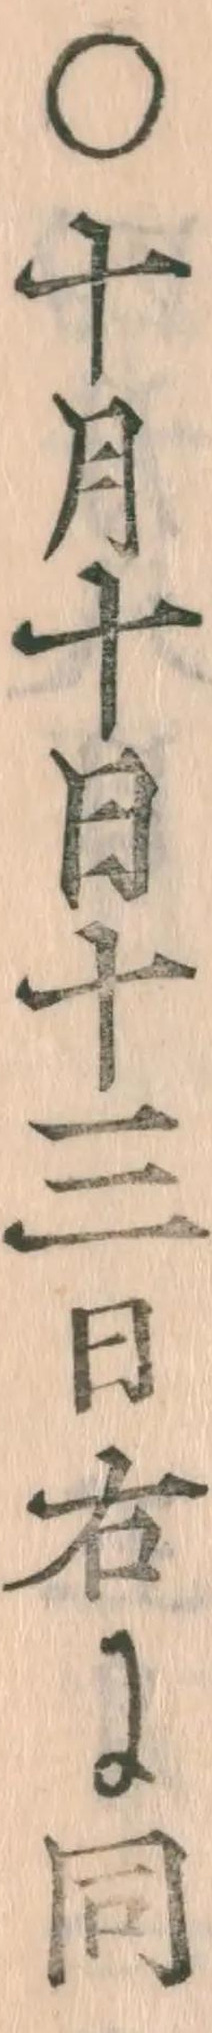〇十月十日十三日右に同
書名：延壽撮要
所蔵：国立国会図書館 National Diet Library, JAPAN
